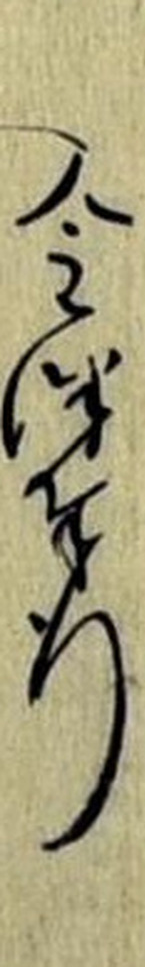金津奉行
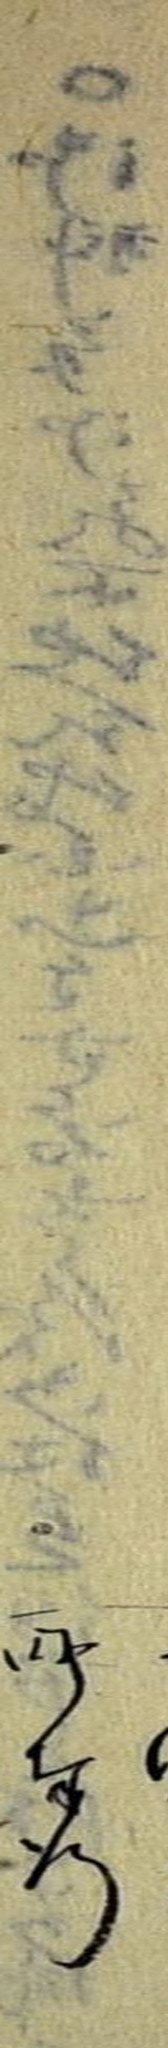町奉行
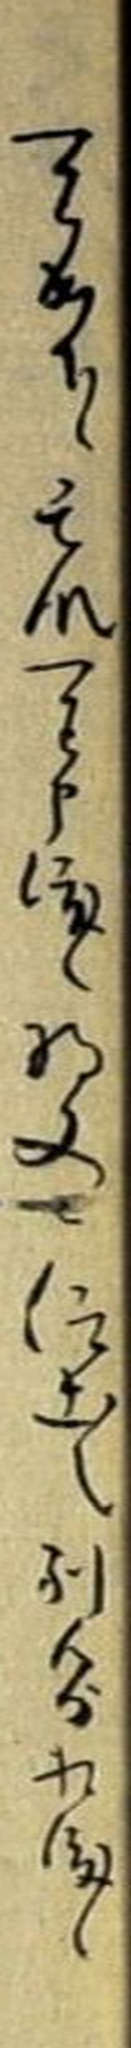可被成下候其段可被申渡候猶又被仰出候別紙相渡候
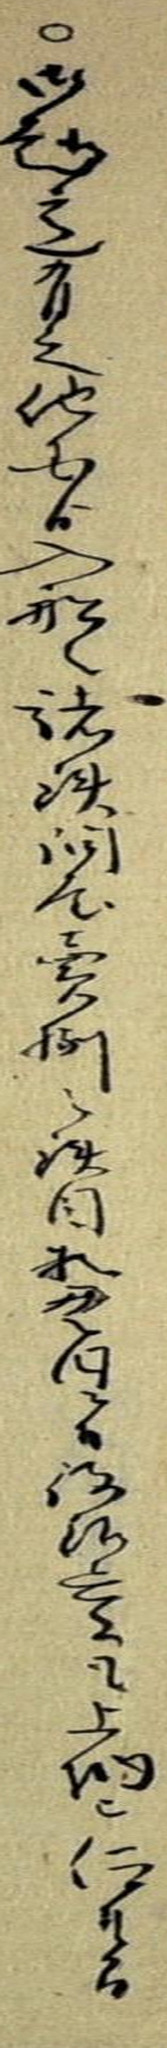○御趣意有之他国ゟ入船之諸鉄問屋売捌之鉄目拾貫目に付役銀壱匁つゝ上納被仰付旨
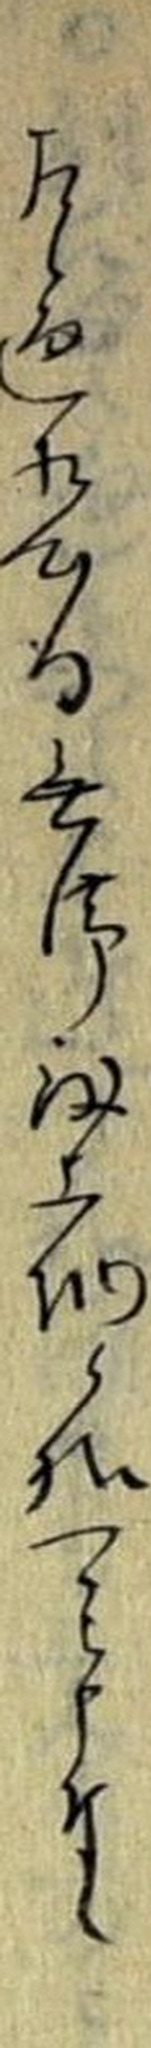右之通相心得無滞致上納候様可被申付候
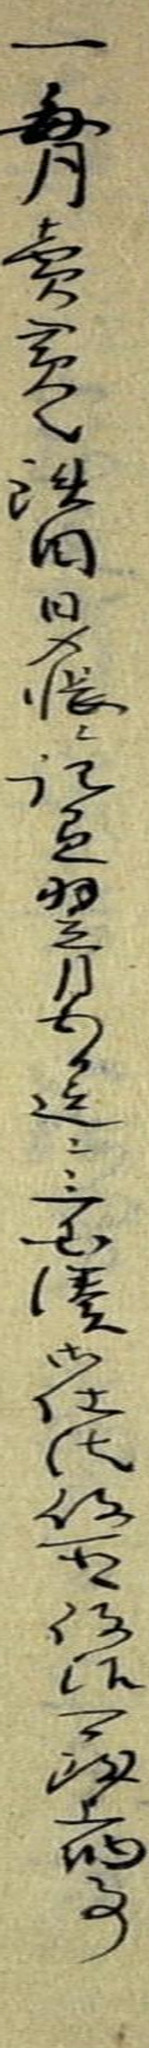一毎月売買之鉄目日〆帳に記置翌月五日迄に三国湊御仕法役所へ役銀可致上納事
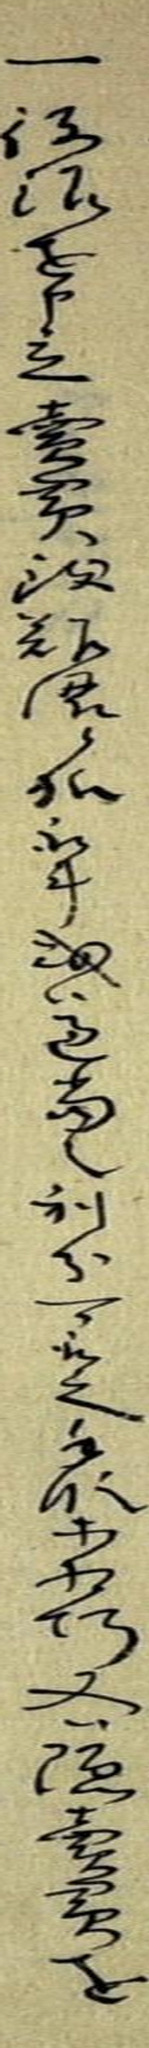一役銀を申立売買致難渋候様取斗或は過当之利分可取之手形等相巧又は隠売買を
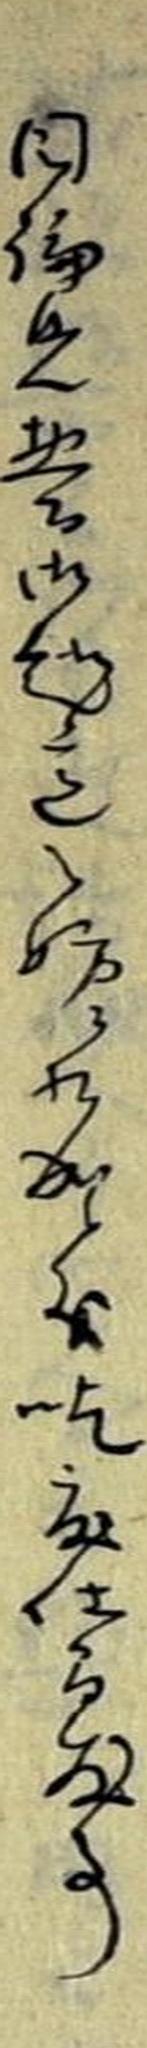目論見惣而御趣意之妨に相成候義吃度仕間敷事
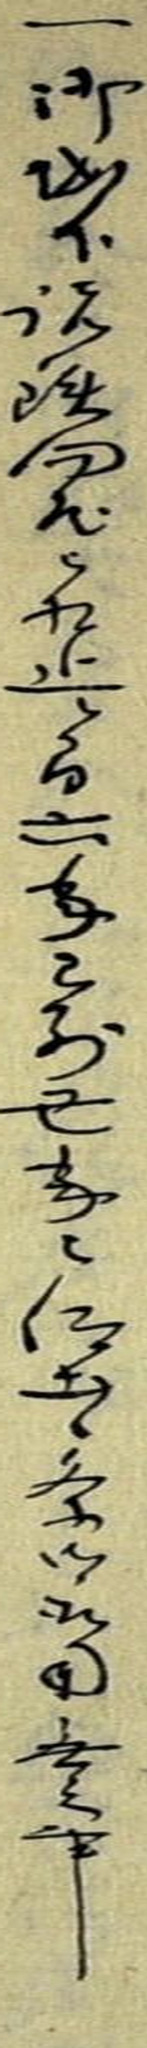一御城下諸鉄問屋被相止候間六年已前丑年被仰出候条御取用無之事
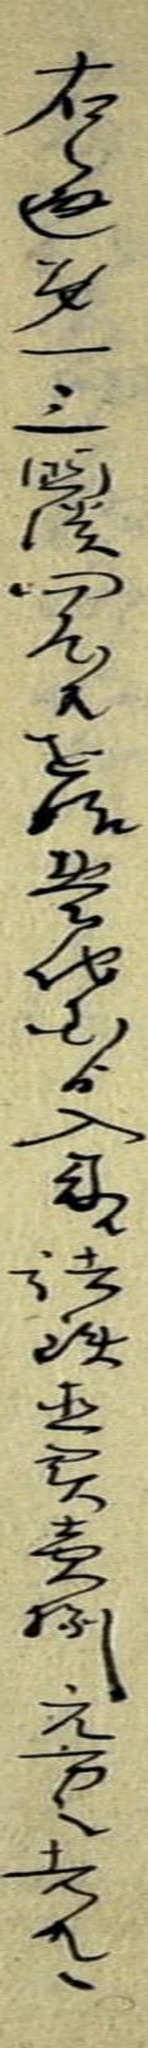右之通第一三国湊問屋共を始決而他国ゟ入来ル諸鉄直買売捌取方之者共へ
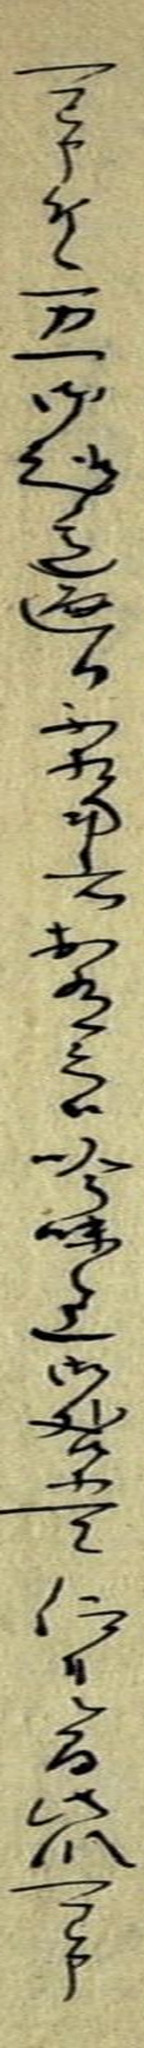可被申付候万一御趣意通り不相用者於有之は吟味之上御咎等可被仰付候間此段可被申
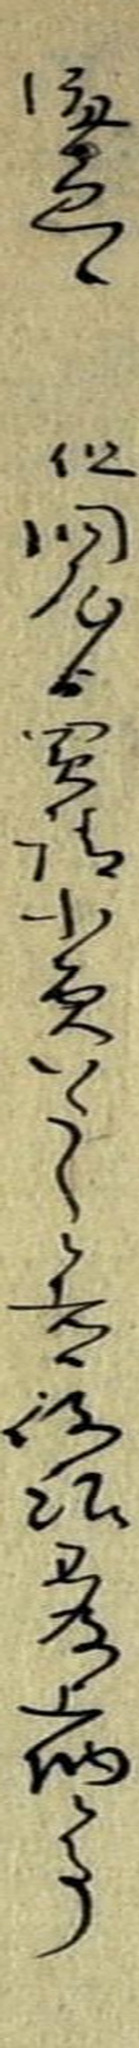渡置候但問屋ゟ買請小売いたし候者は役銀不及上納候事
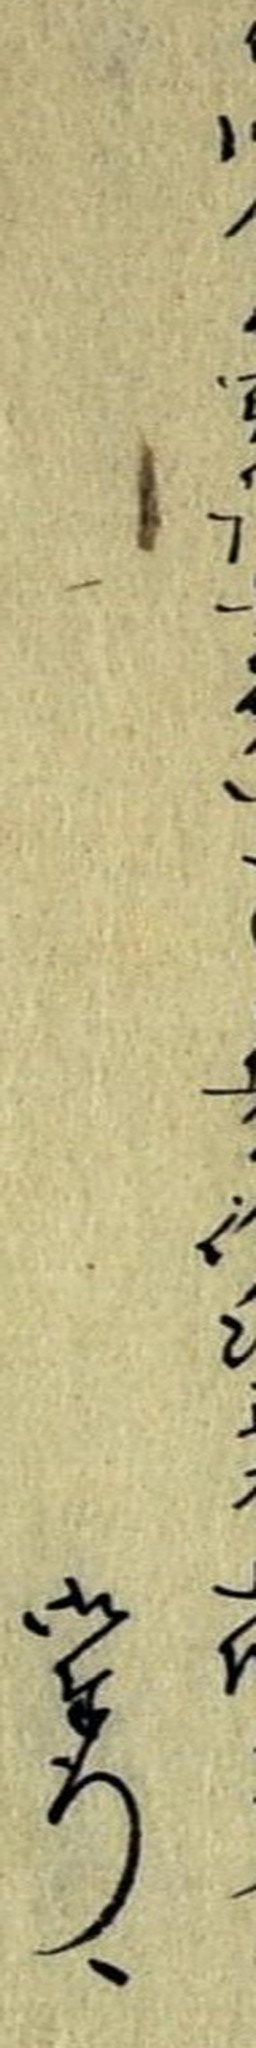御奉行へ
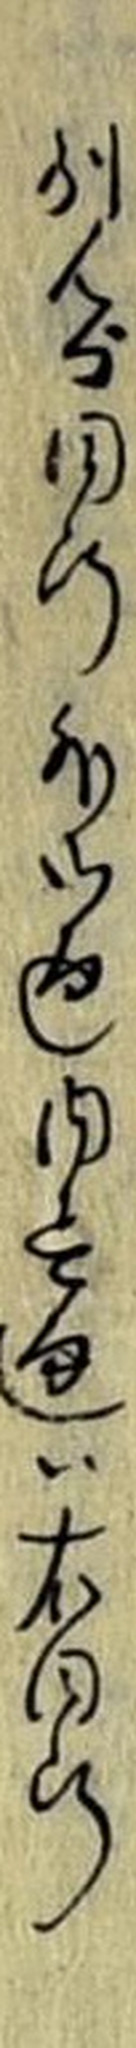別紙同断外弐通内壱通は右同断
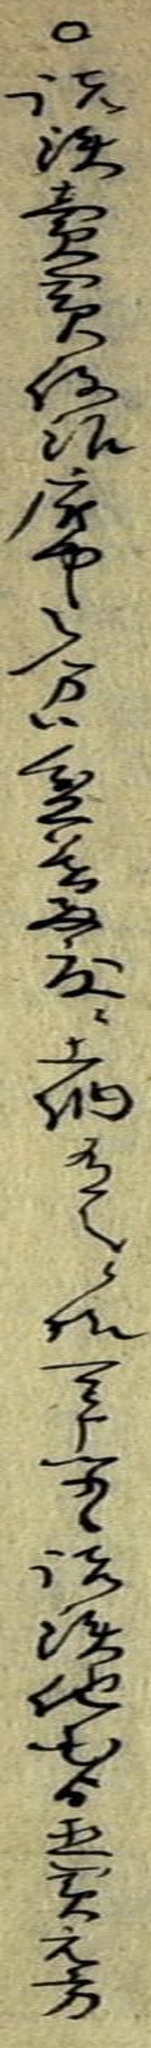○諸鉄売買役銀府中之分は盆暮両度に上納有之候様可被申聞候諸鉄他国ゟ直買元方
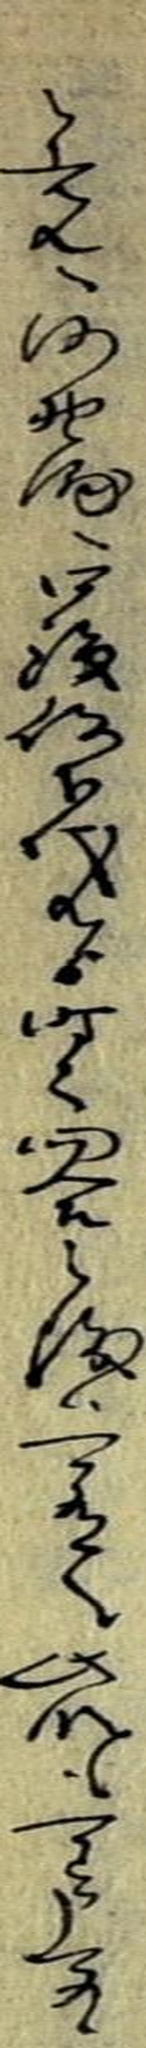之者共へ河野浦へ口銭役下代共ゟ町々へ問合之儀ハ可有之此段も可被申聞候
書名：命令之部 四
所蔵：福井県文書館 Fukui Prefectural Archives
